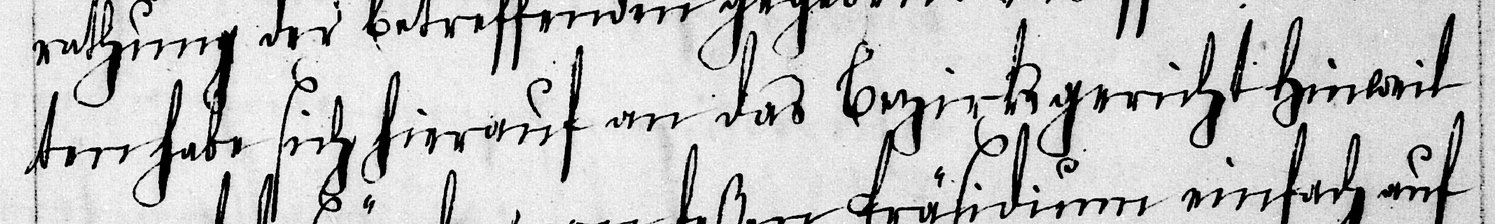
ten habe sich hierauf an das Bezirksgericht Hinweil
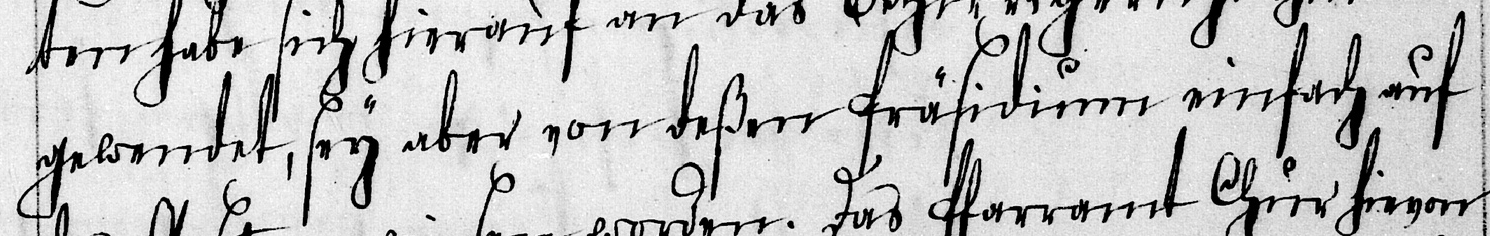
gewendet, sey aber von deßen Präsidium einfach auf
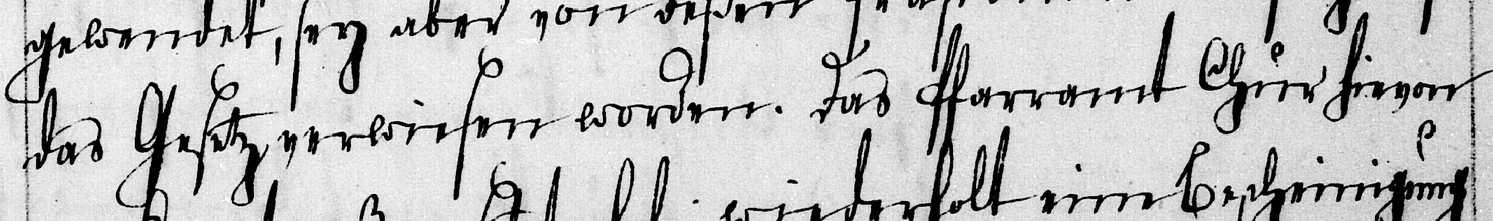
das Gesetz verwiesen worden. Das Pfarramt Chur hievon
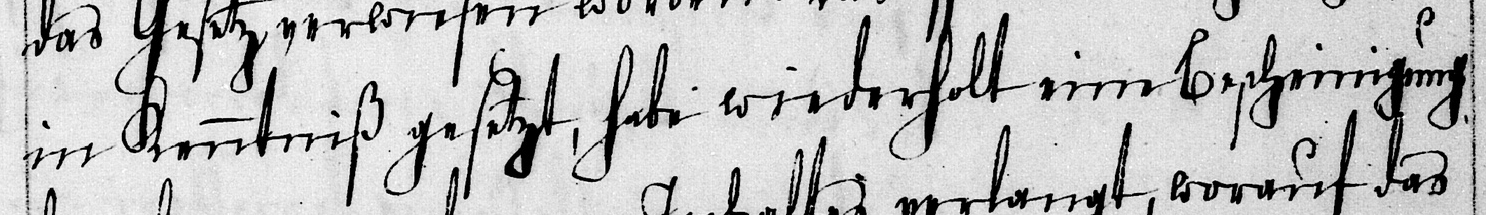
in Kenntniß gesetzt, habe wiederholt eine Bescheinigung
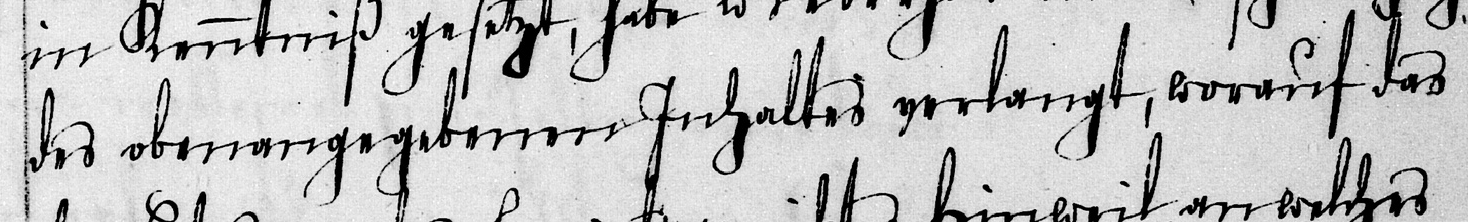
des obenangegebenen Inhaltes verlangt, worauf das
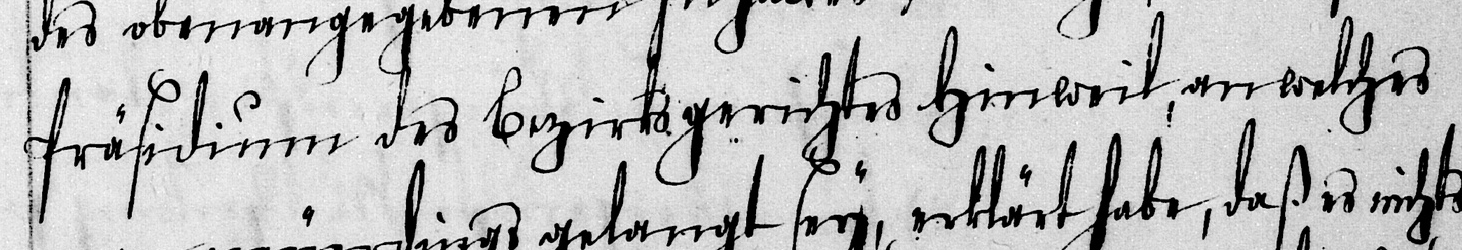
Präsidium des Bezirksgerichtes Hinweil, an welches
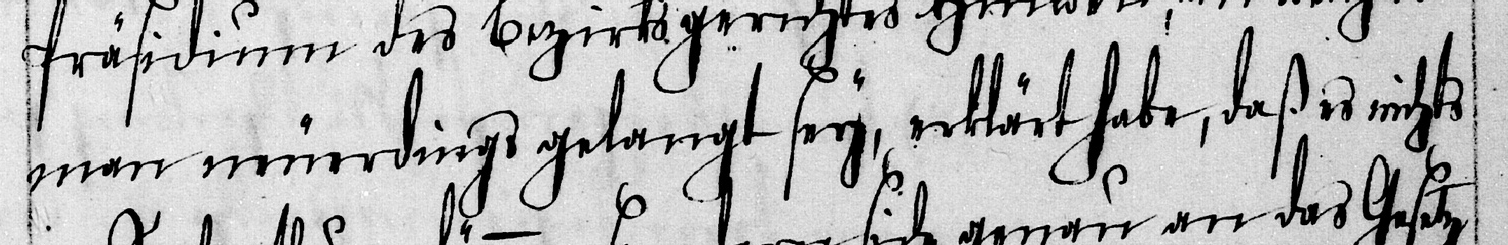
man neuerdings gelangt sey, erklärt habe, daß es nichts
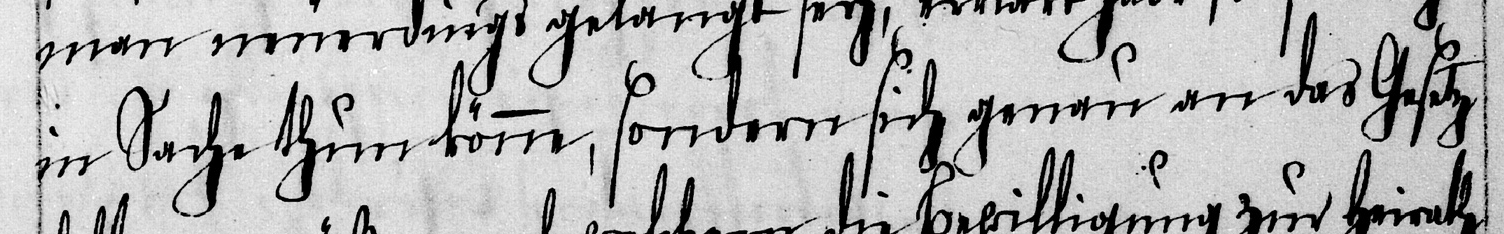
in Sache thun könne, sondern sich genau an das Gesetz
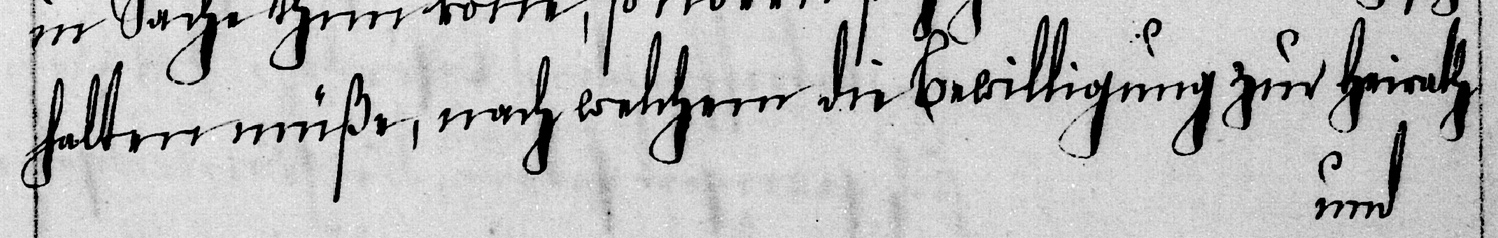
halten müße, nach welchem die Bewilligung zur Heirath
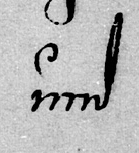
und
